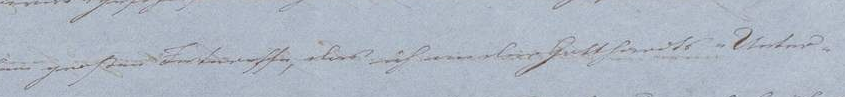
dem großen Interesse, das ich an der Gotthardtsli-Unter-
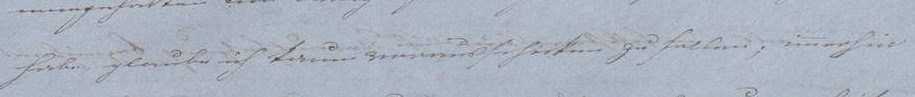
habe, glaube ich kaum vorausschicken zu sollen; immerhin
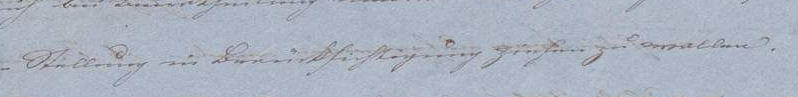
meine Stellung in Berücksichtigung ziehen zu wollen.
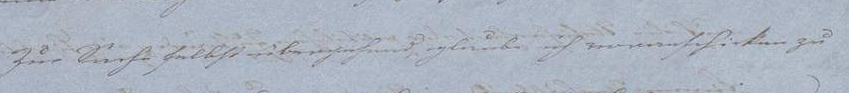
Zur Sache selbst übergehend, glaube ich vorausschicken zu
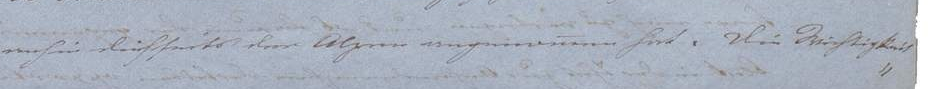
anhin diesseits der Alpen angenommen hat. Die Wichtigkeit,
